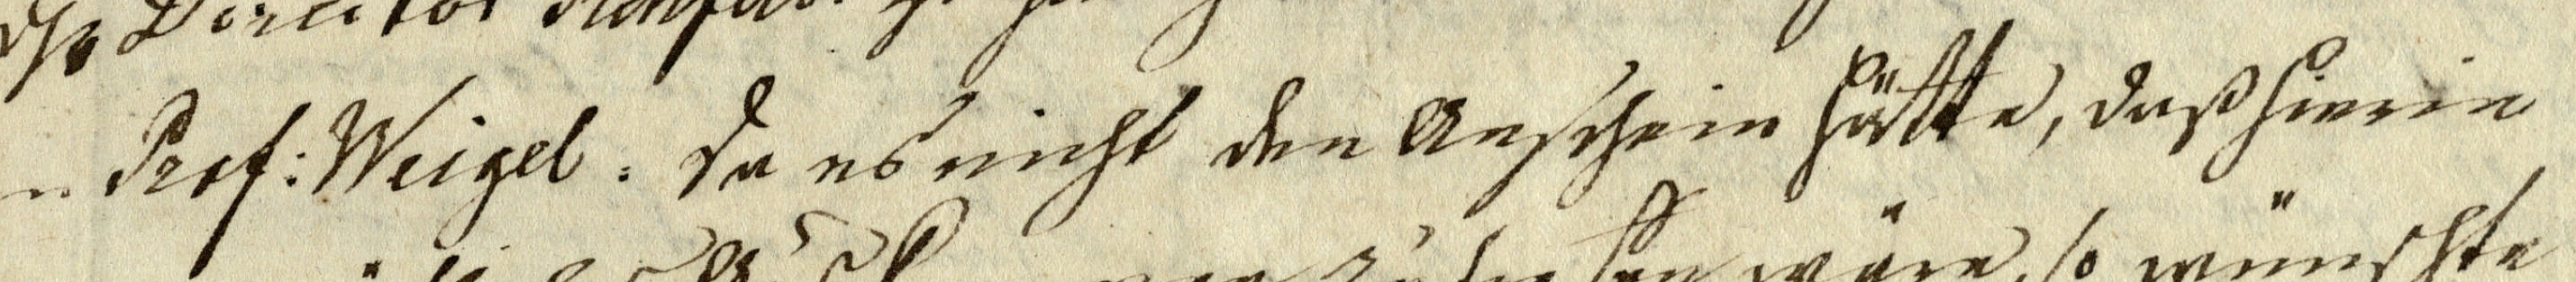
Prof. Weigel. Da es nicht den Anschein hätte, daß hierin
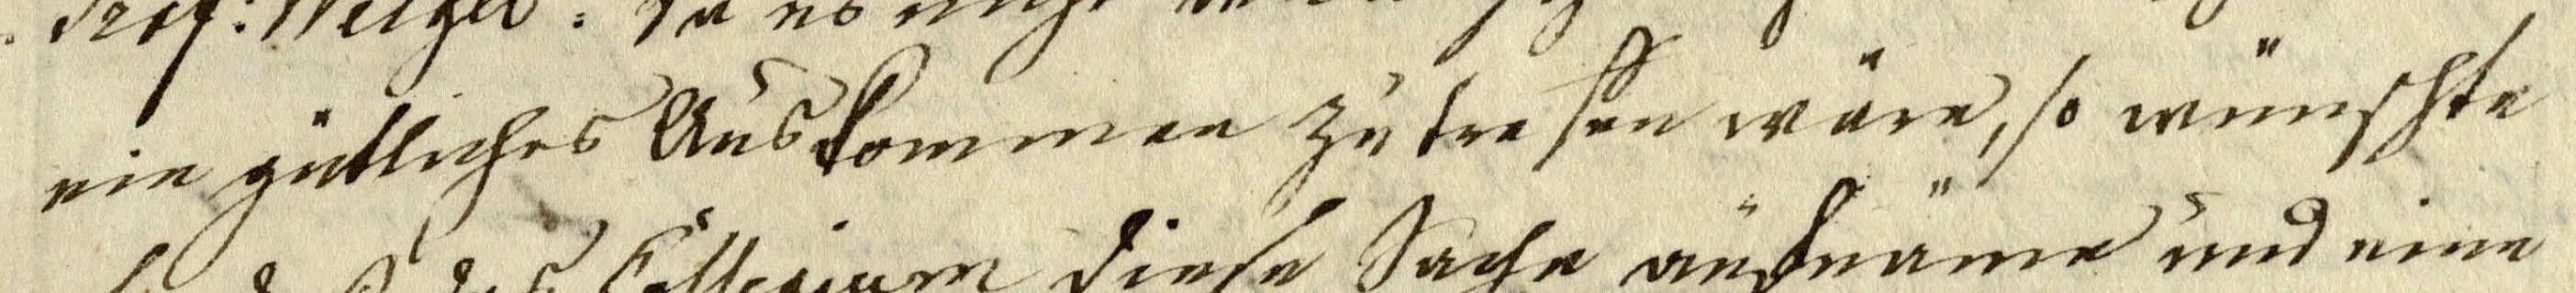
ein gütliches Auskommen zu treffen wäre, so wünschte
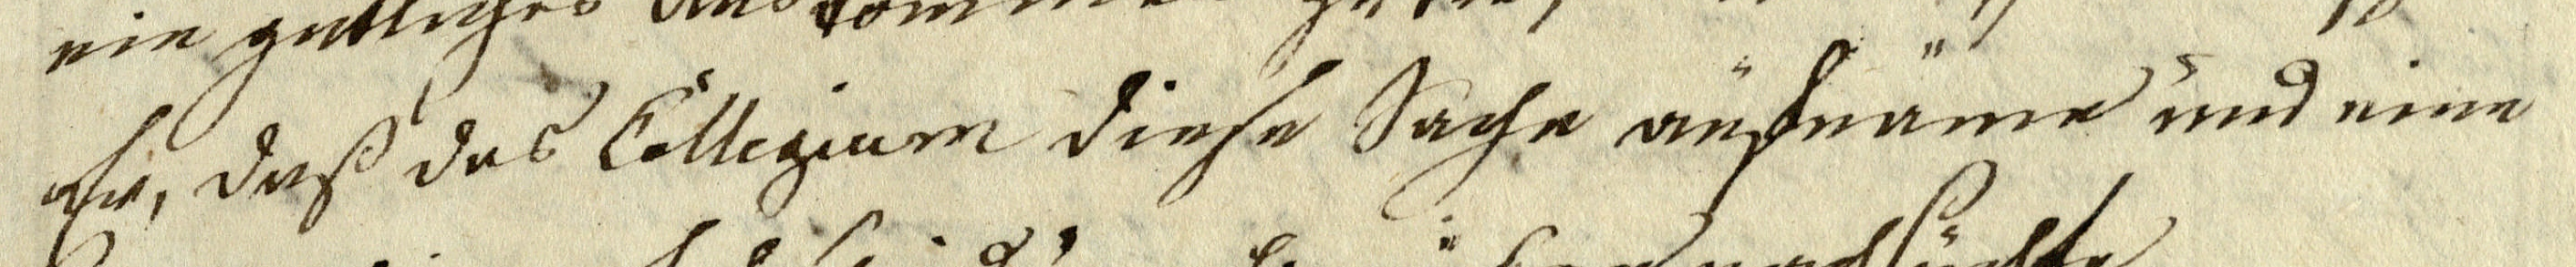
Er, daß das Collegium dieseSache aufnäme und eine
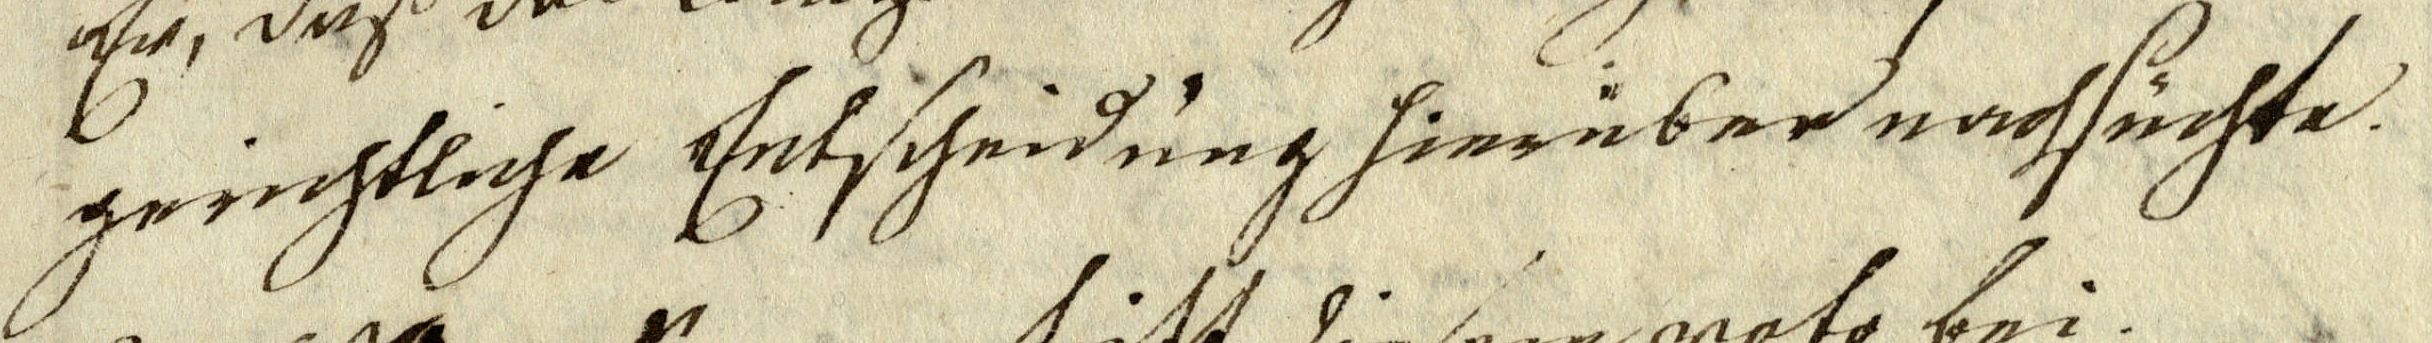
gerichtliche Entscheidung hierüber nachsuchte.
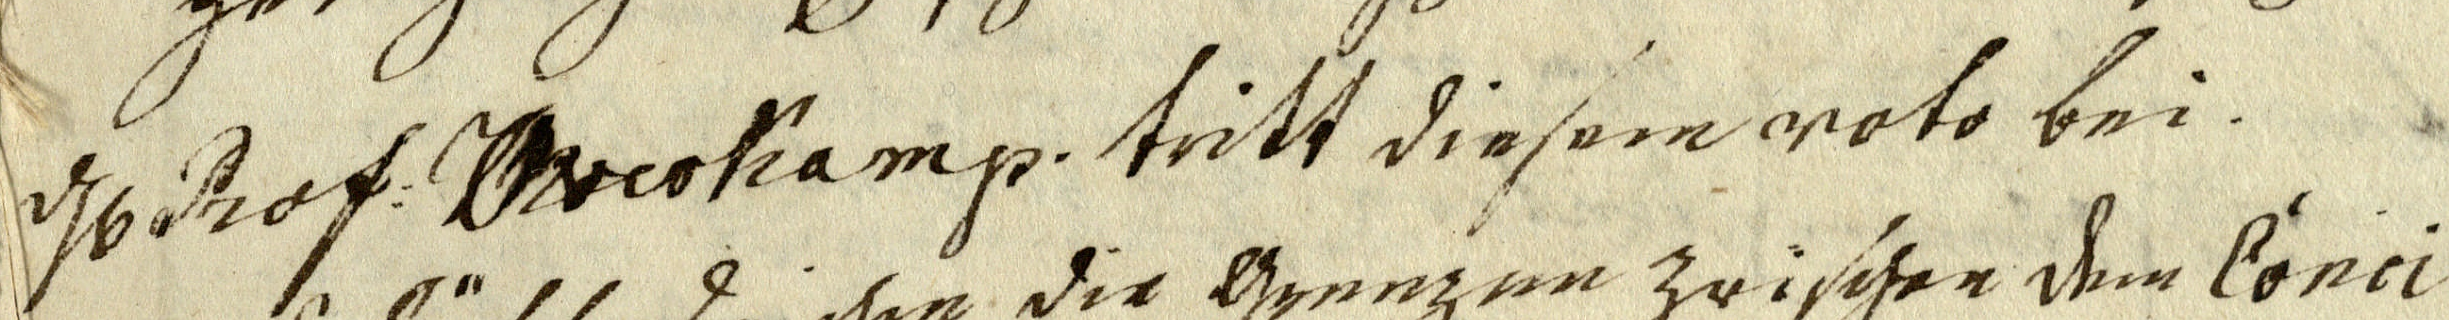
dh Prof. Overkamp. tritt diesem voto bei.
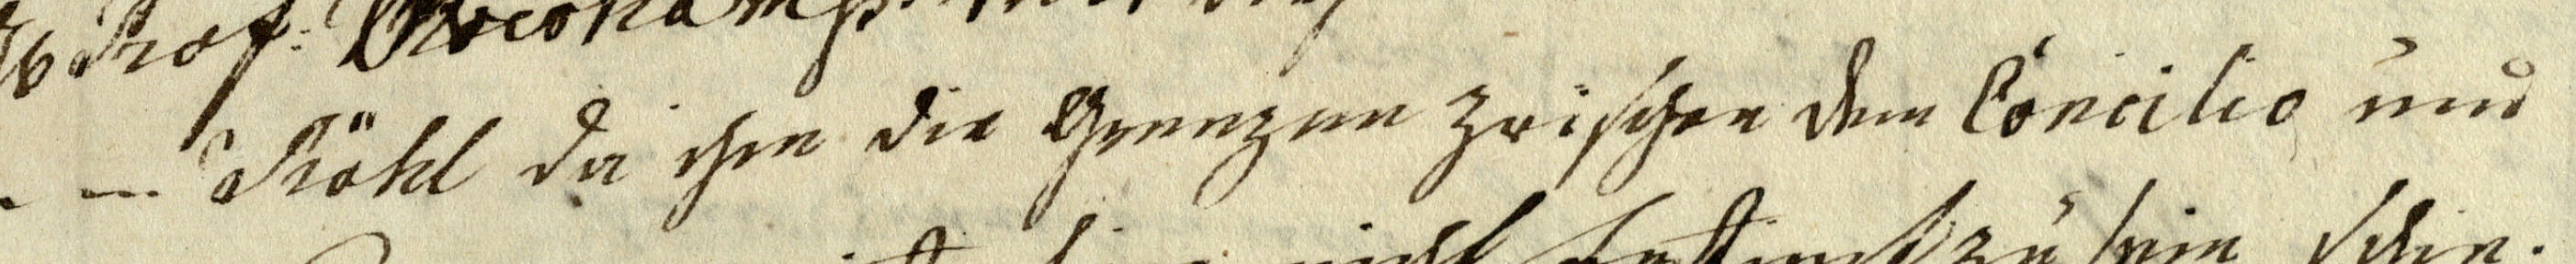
Röhl da ihm die Grenzen zwischen dem Concilio und
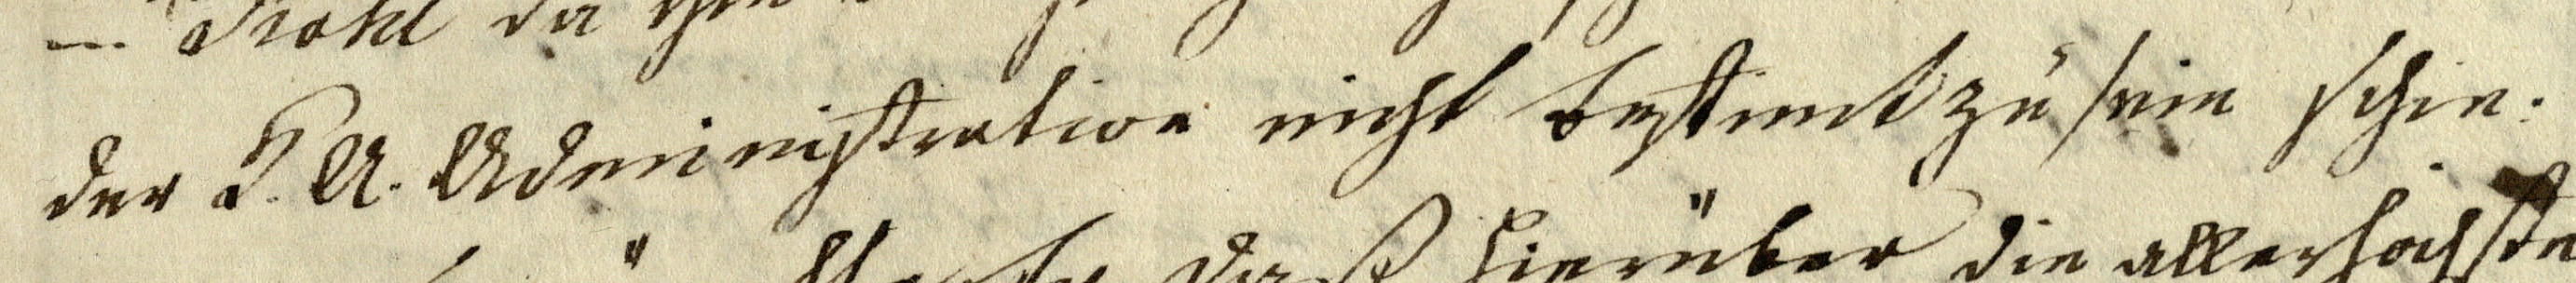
der K. A. Administration nicht bestimt zu sein schie¬
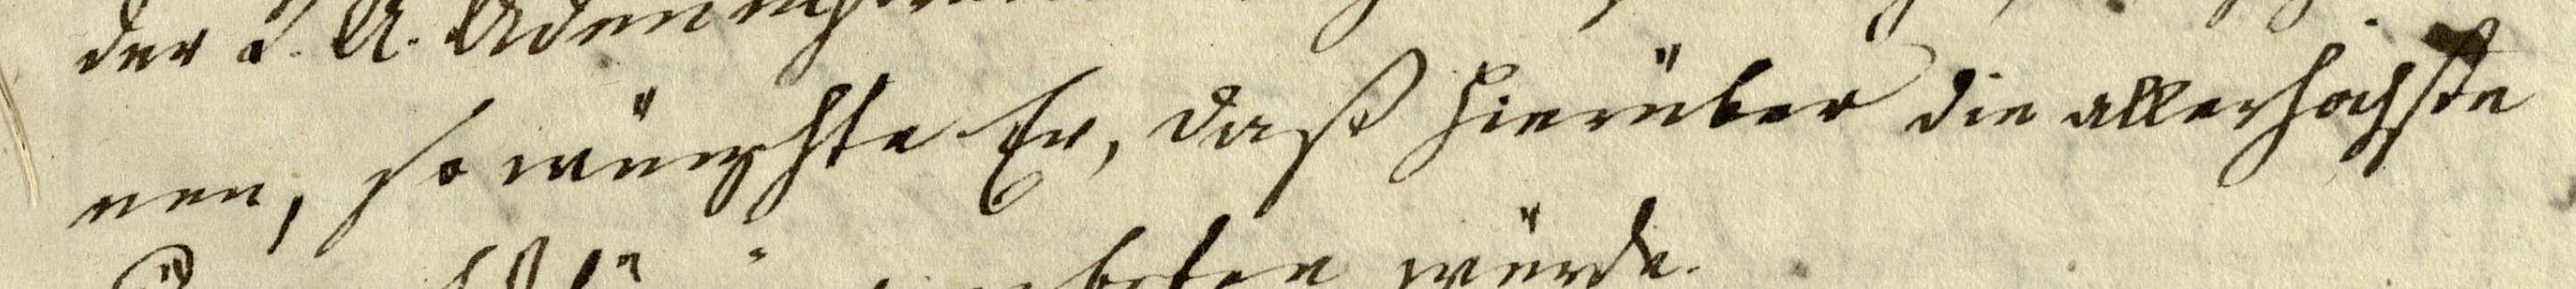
nen, so wünschte Er, daß hierüber die allerhöchste
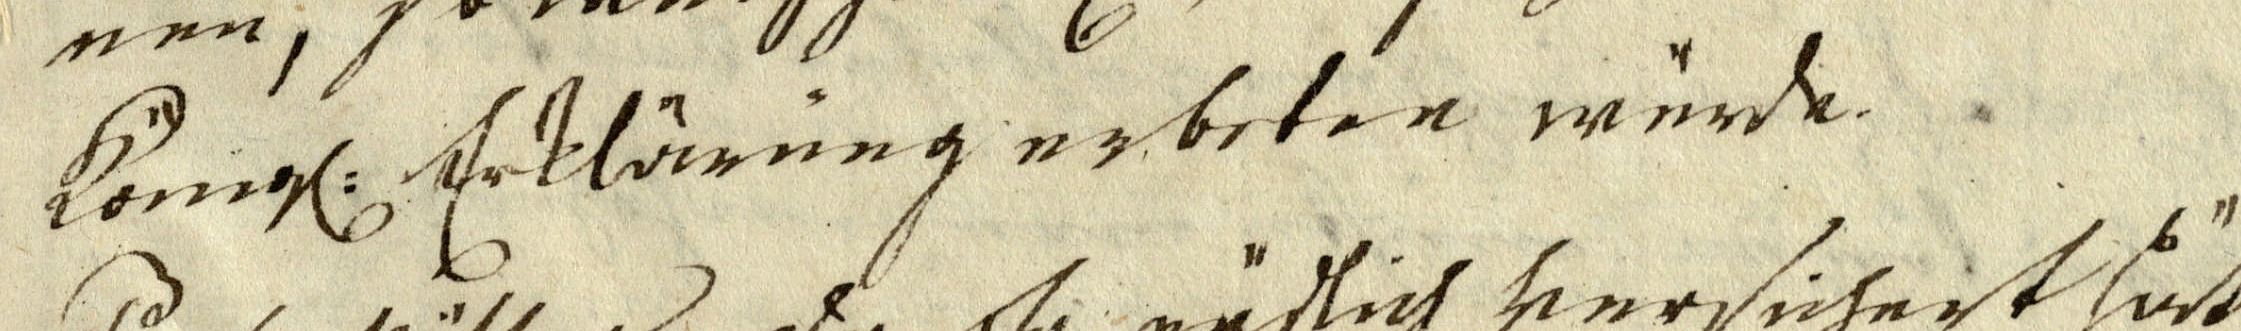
Königl. Erklärung erbeten würde.
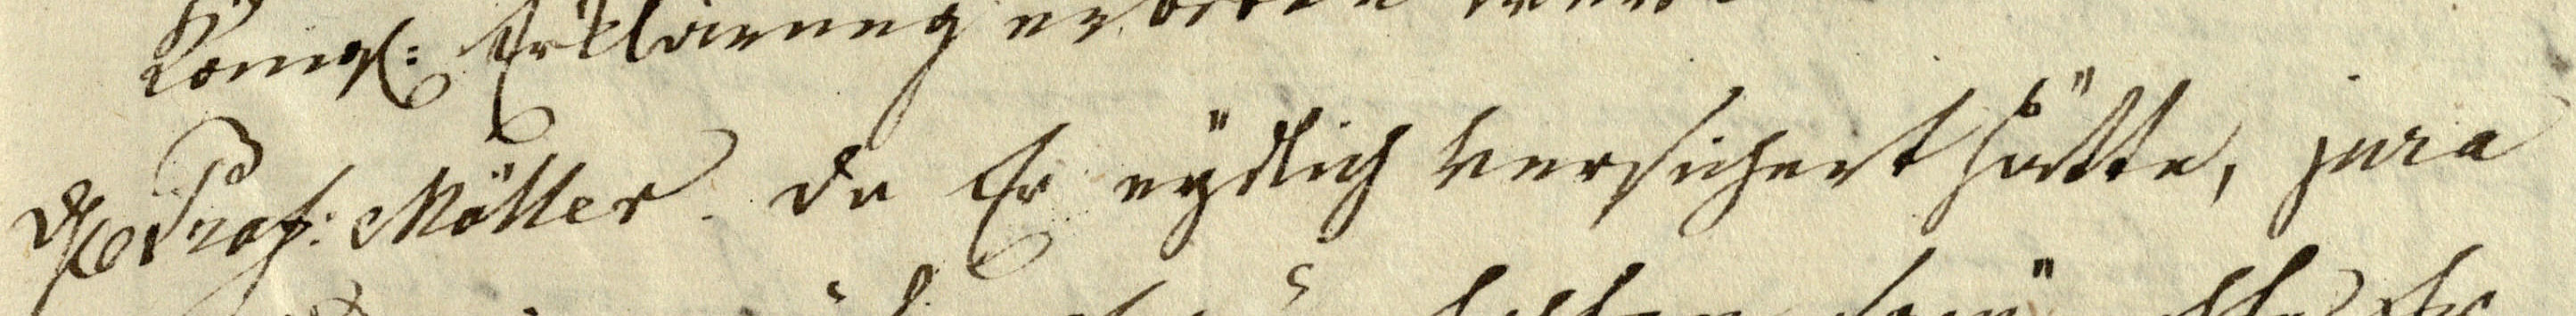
dh Prof. Möller. da Er eÿdlich versichert hätte, jura
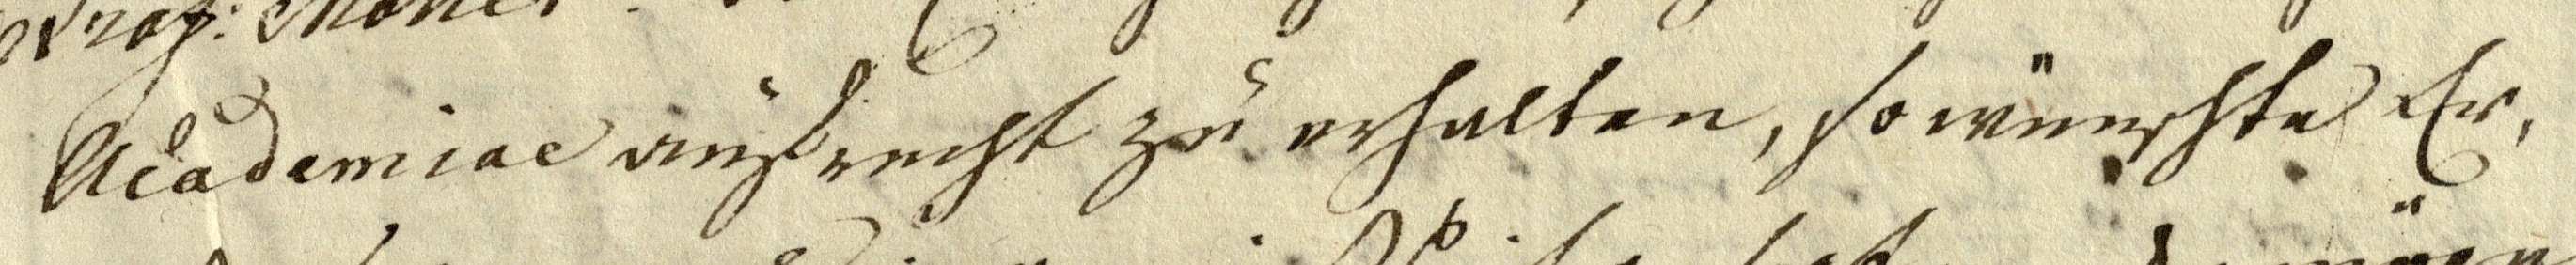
Academiae aufrecht zu erhalten, so wünschte Er,
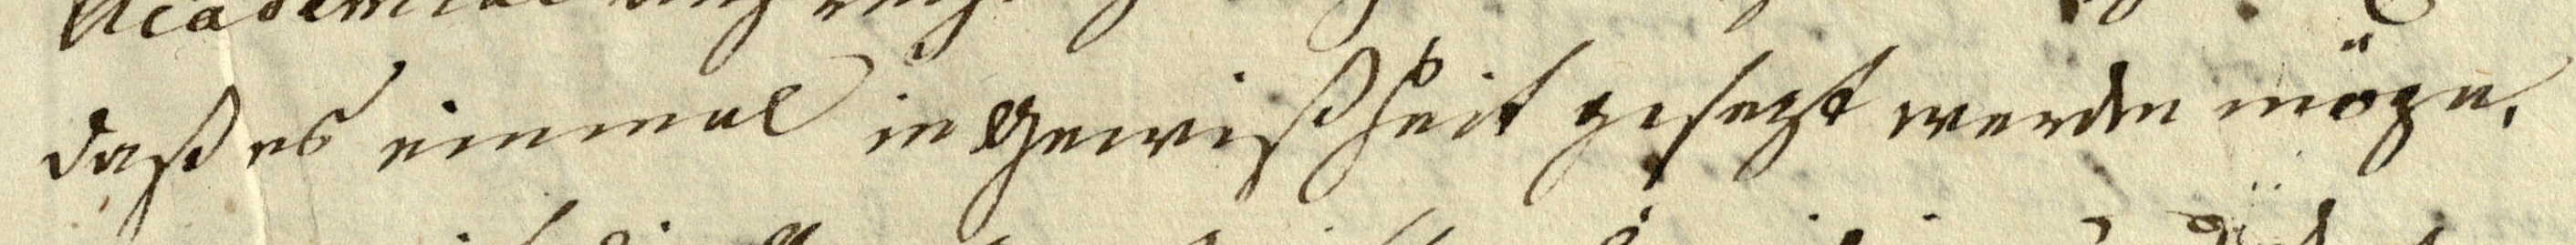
daß es einmal in Gewißheit gesezt werden möge,
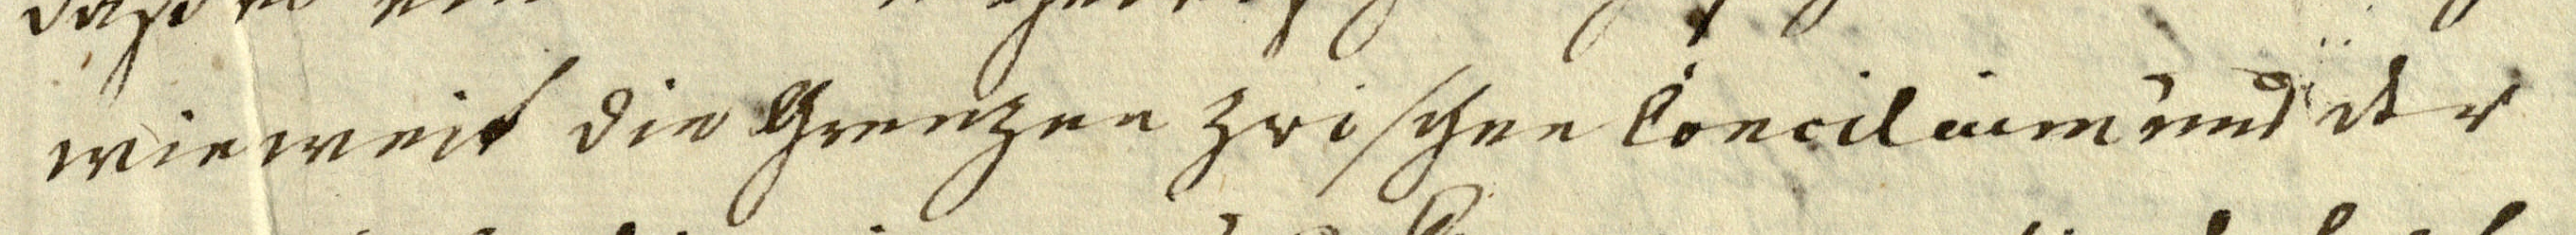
wieweit die Grenzen zwischen Concilium und der
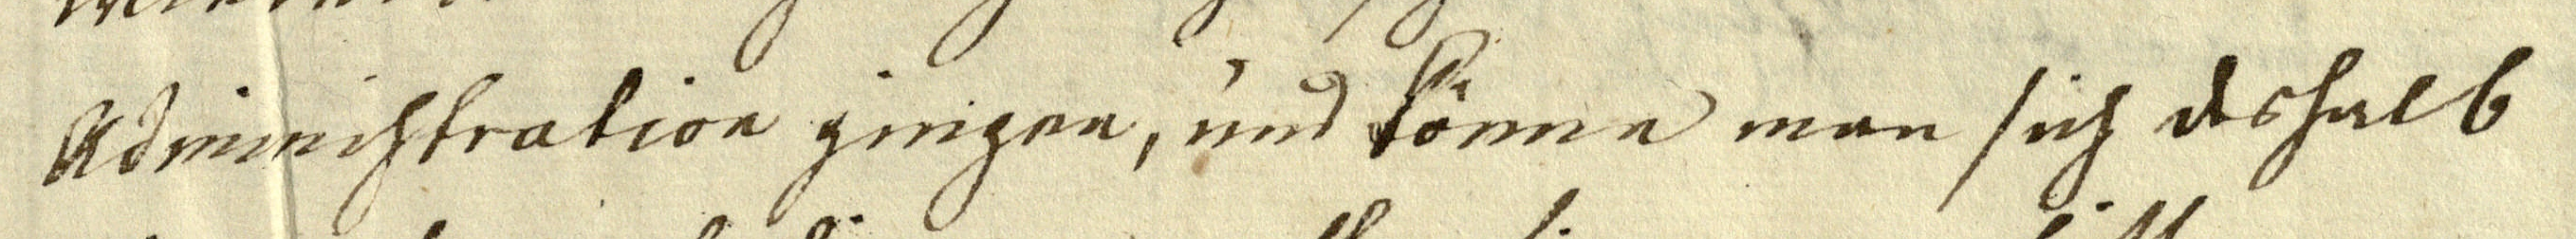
Administration gingen, und könne man sich deshalb
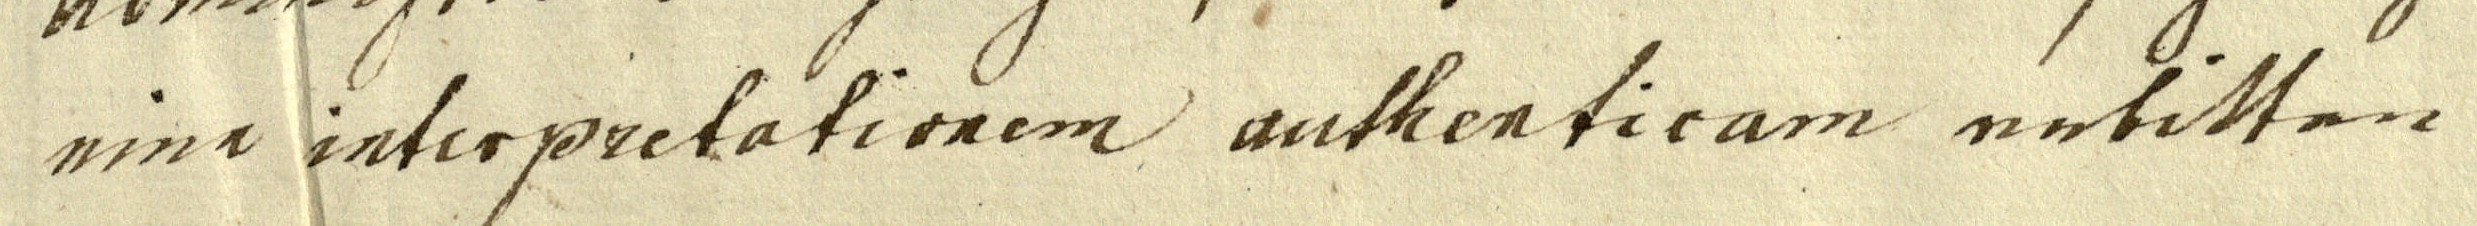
eine interpretationem authenticam erbitten.
